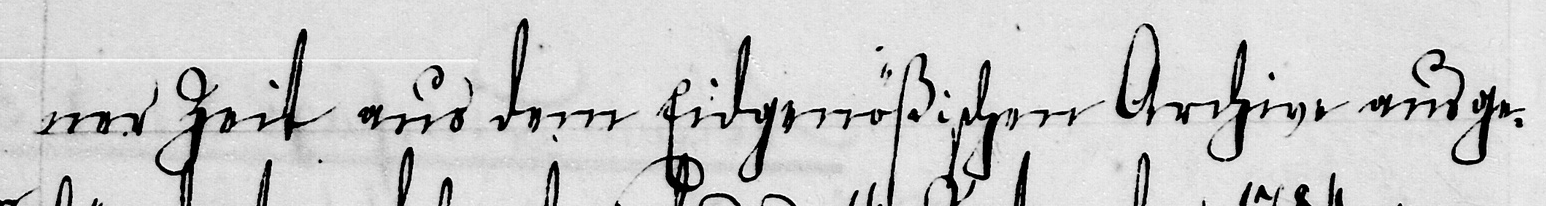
ner Zeit aus dem Eidgenößischen Archive ausge¬
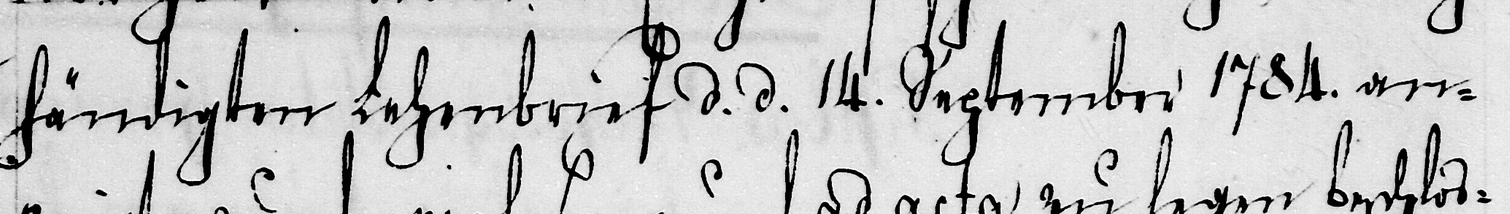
händigten Lehenbrief d. d. 14. September 1784. ang¬
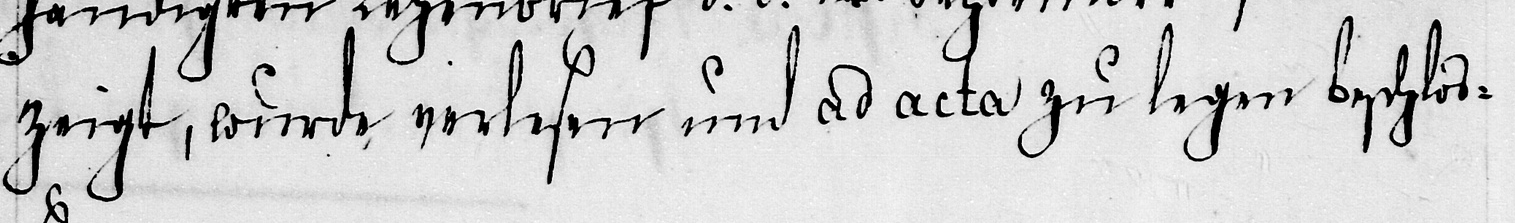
ezeigt, wurde verlesen und ad acta zu legen beschloß¬
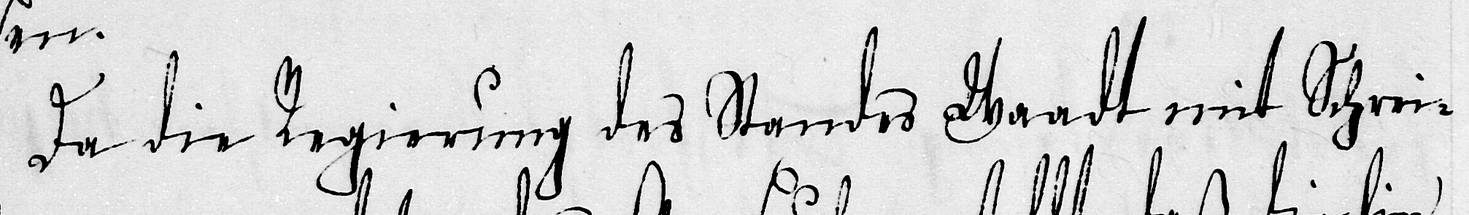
Da die Regierung des Standes Waadt mit Schrei¬
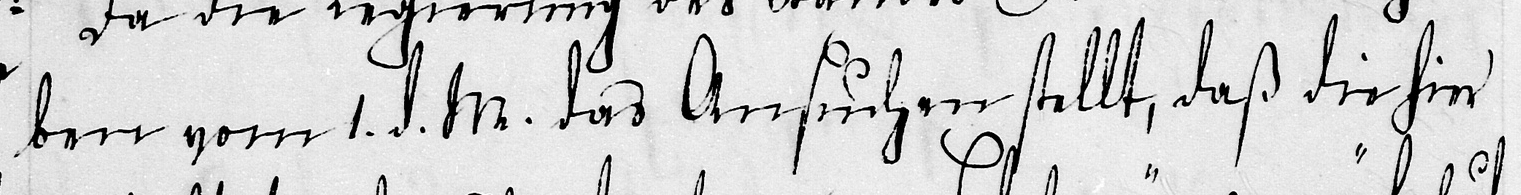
ben vom 1. d. M. das Ansuchen stellt, daß die hier
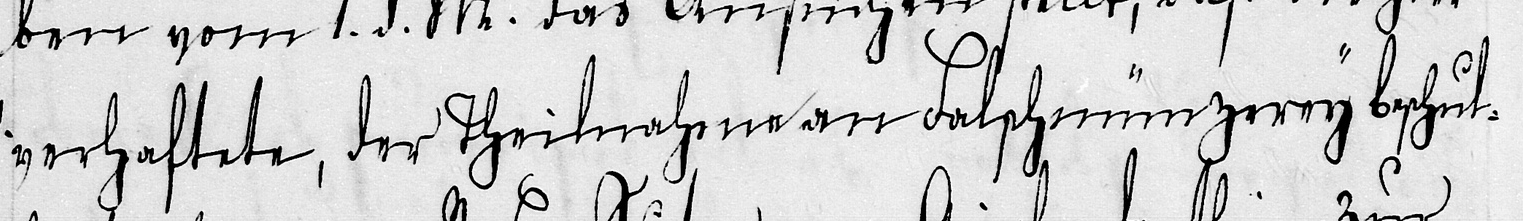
verhaftete, der Theilnahme an Falschmünzerey beschul¬
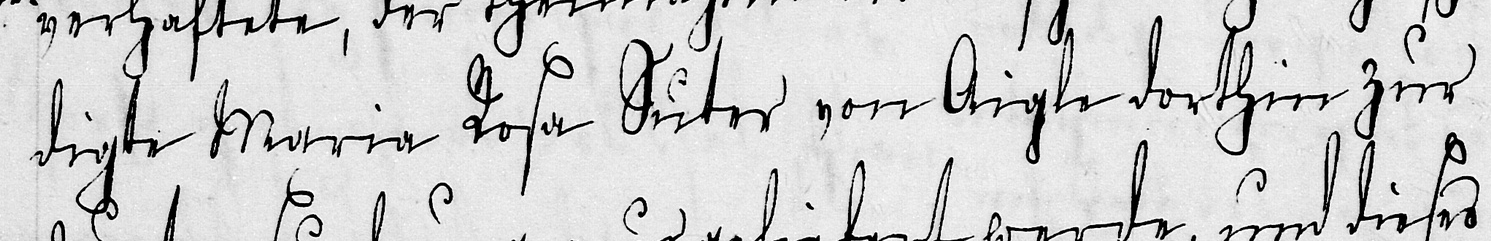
digte Maria Rosa Suter von Aigle dorthin zur
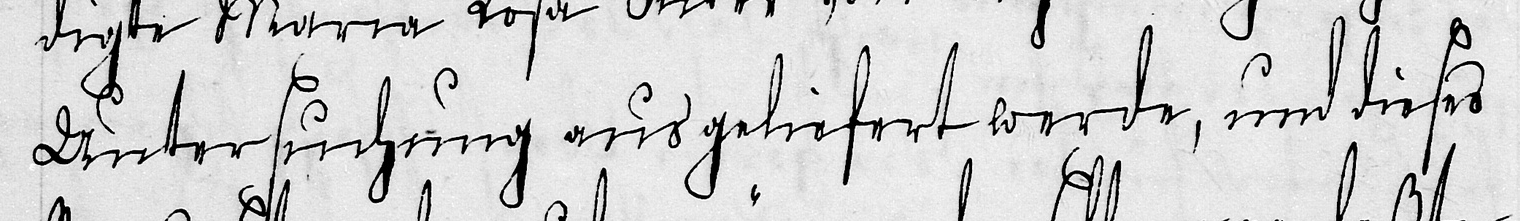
Untersuchung ausgeliefert werde, und dieses
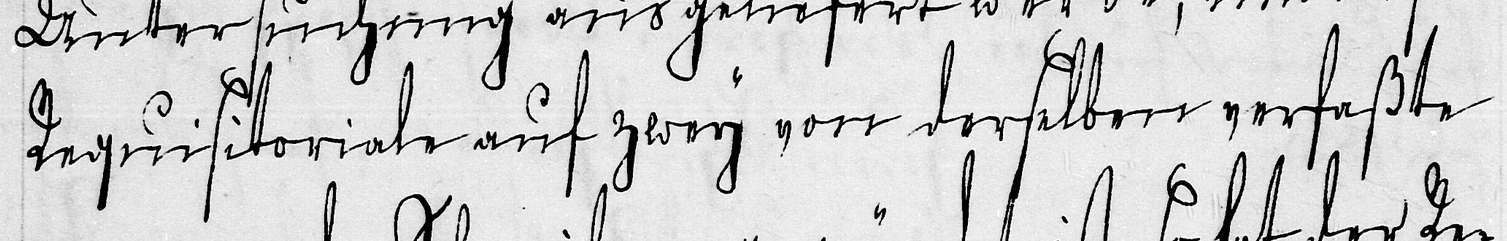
Requisitoriale auf zwey von derselben verfaßte
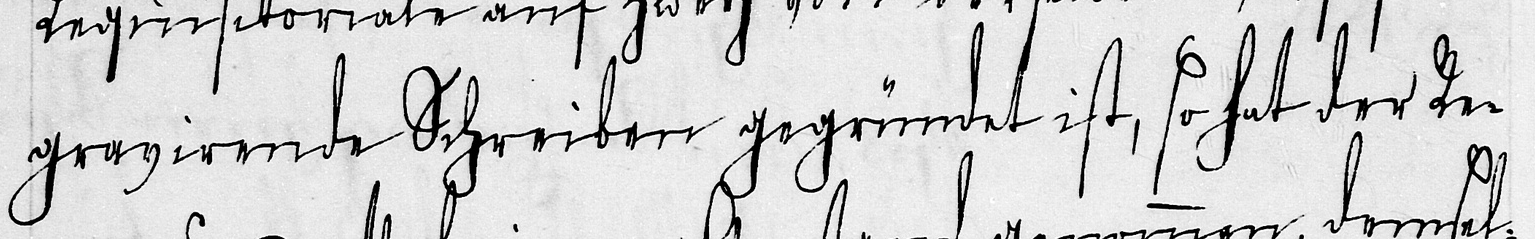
gravirende Schreiben gegründet ist, so hat der Re¬
